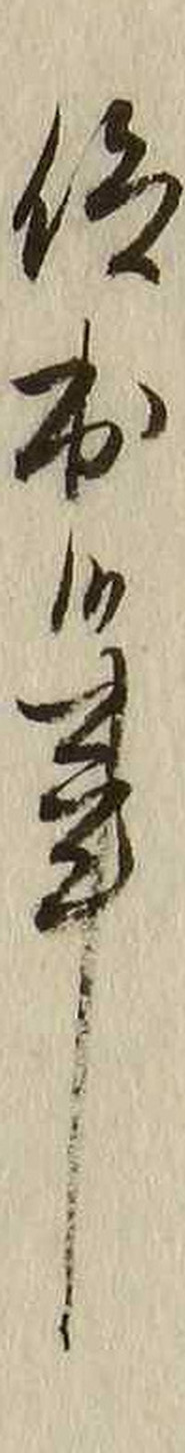仰出候事
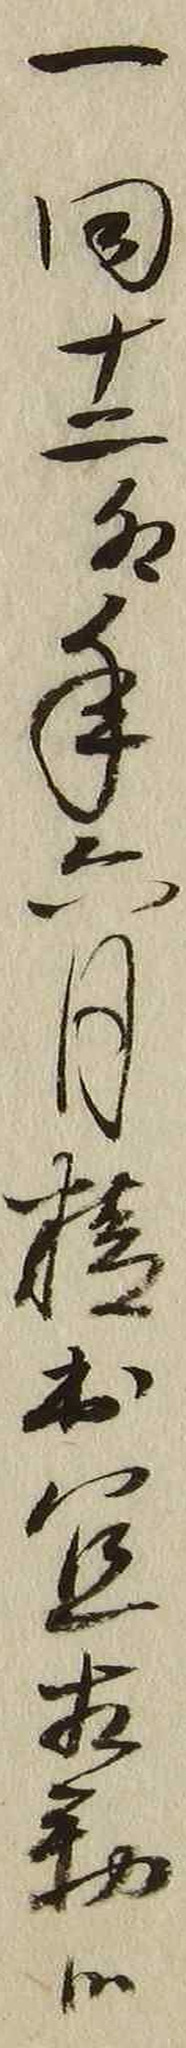一同十二卯年六月精出宜相勤候
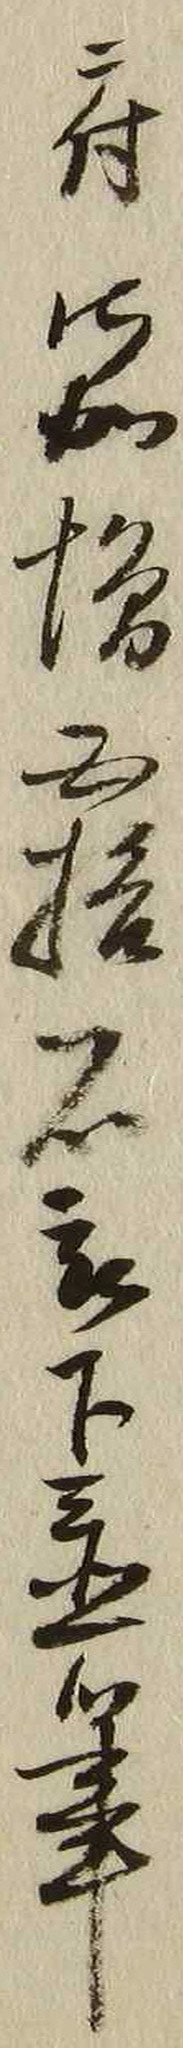ニ付御加増五拾石被下置候事
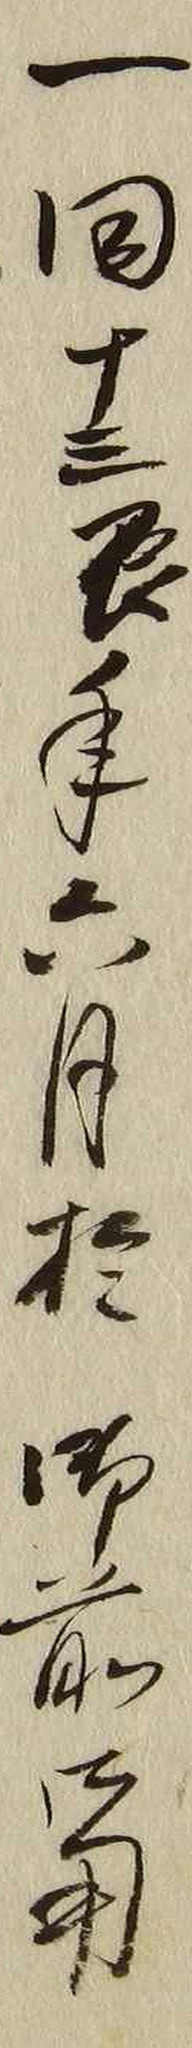一同十三辰年六月於御前御用
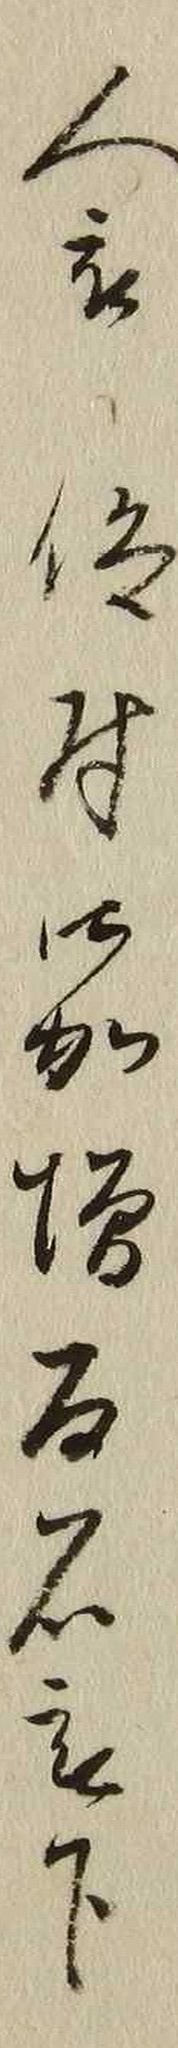人被仰付御加増百石被下
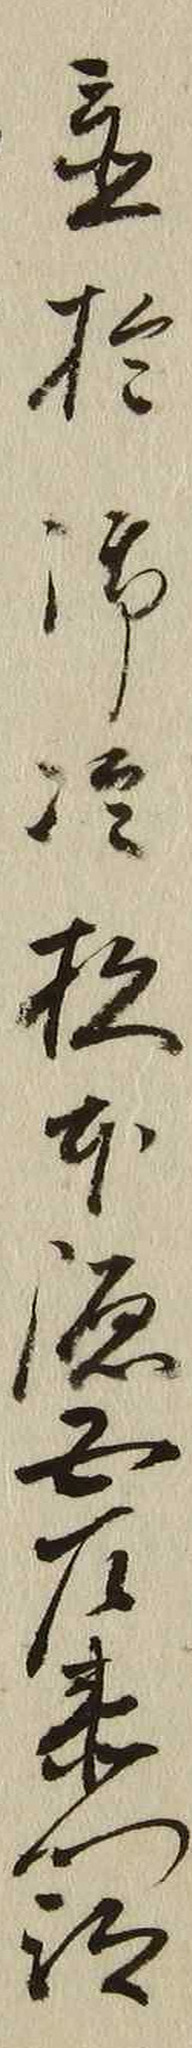置於御次杉本源五左衛門跡
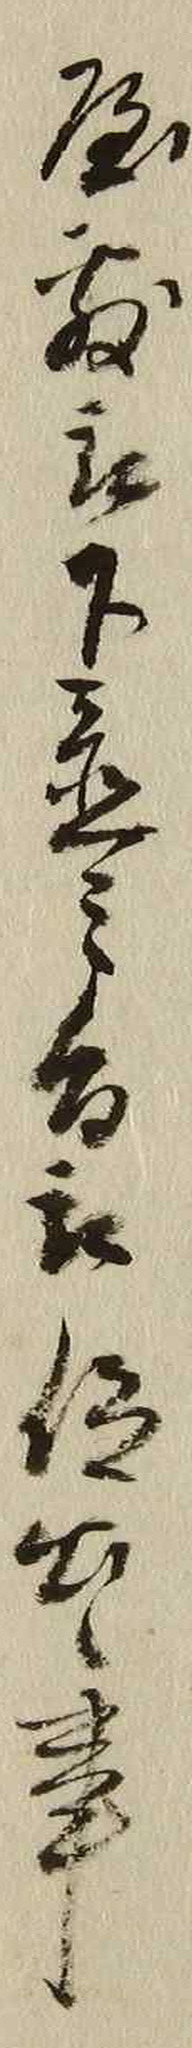屋敷被下置之旨被仰出候事
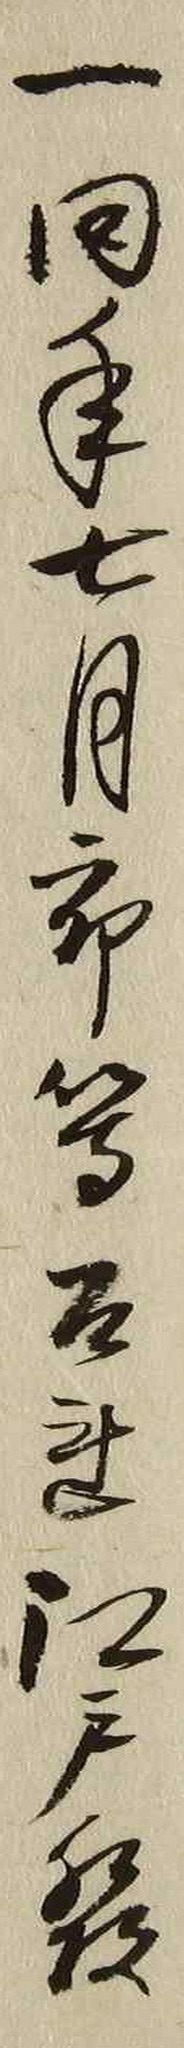一同年七月郎等召連江戸発
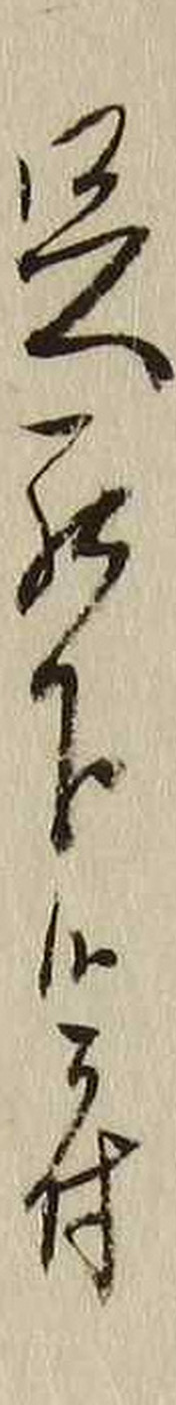足罷下候ニ付
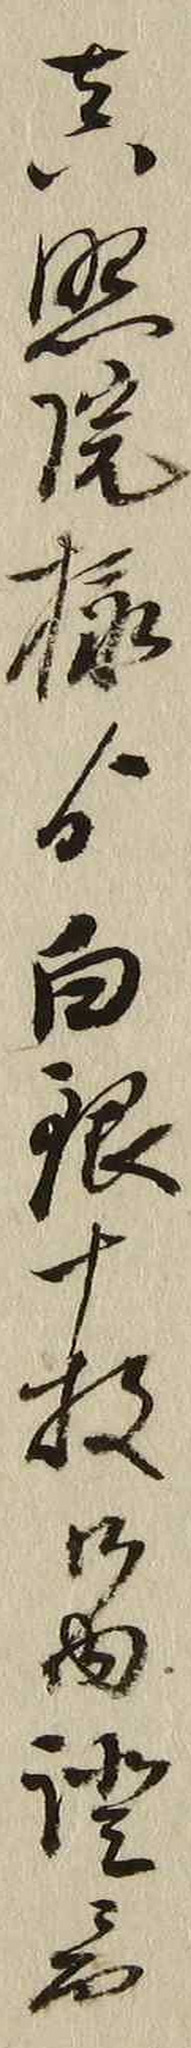真照院様ゟ白銀十枚御内証ニ而
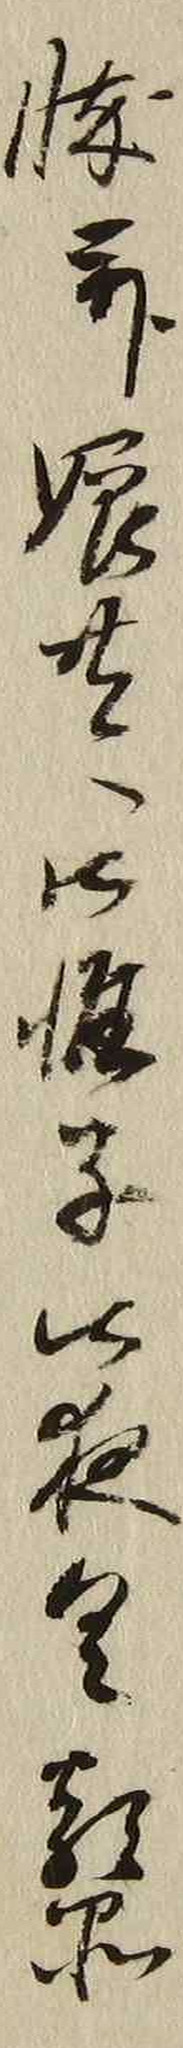忰并娘共へ御帳子御夜具類品
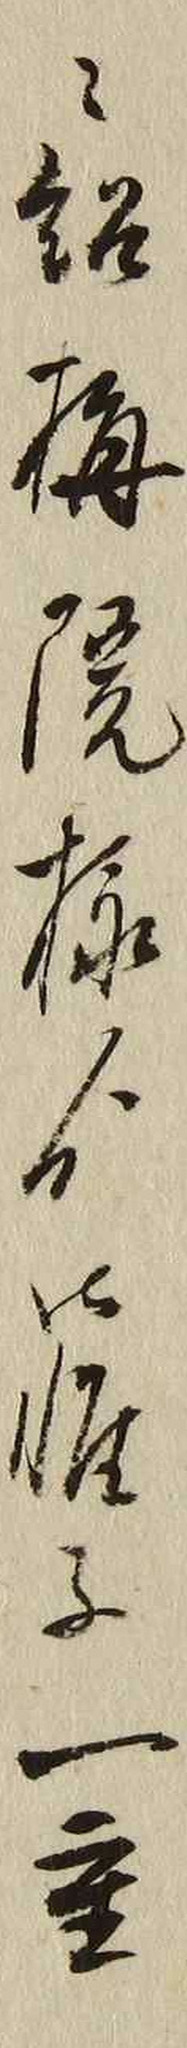々紹栴院様ゟ御帷子一重
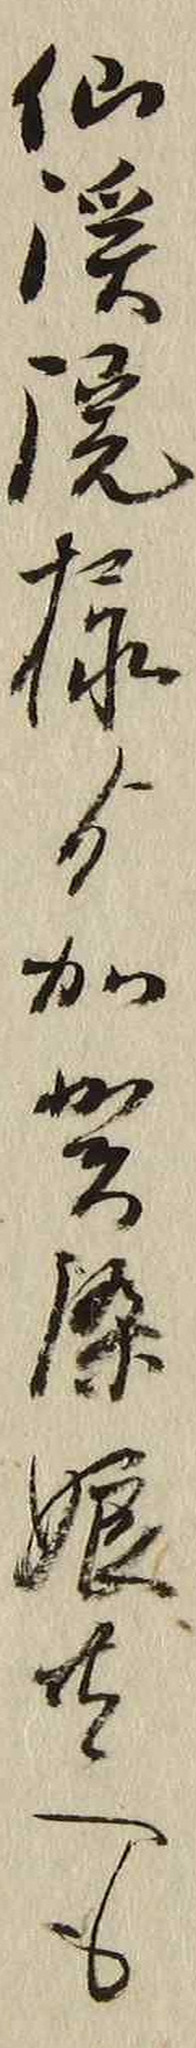仙渓院様ゟ加賀染娘共へも
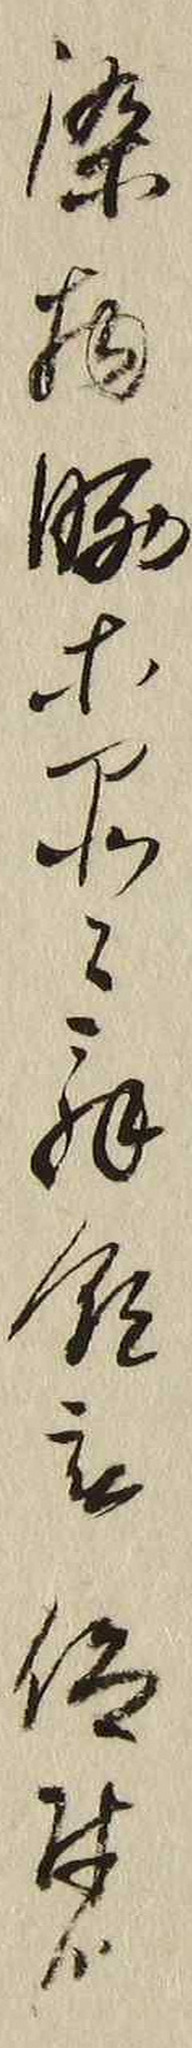染物晒等品々拝領被仰付候
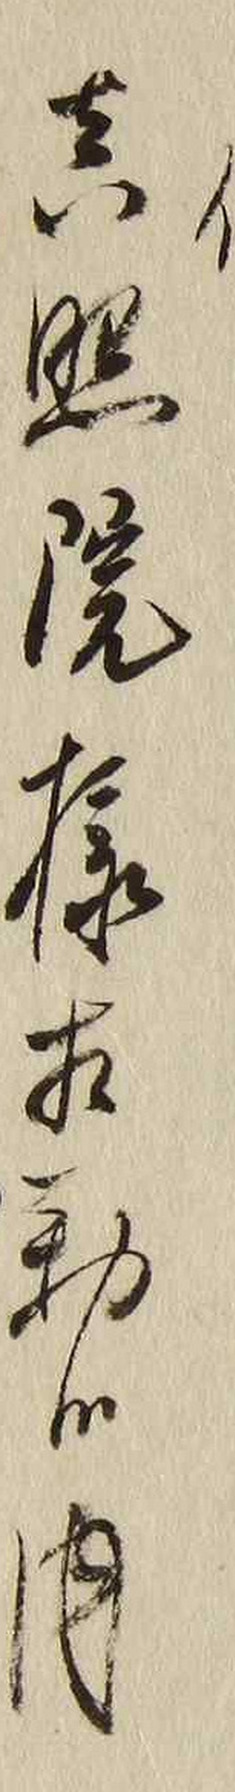真照院様相勤候内
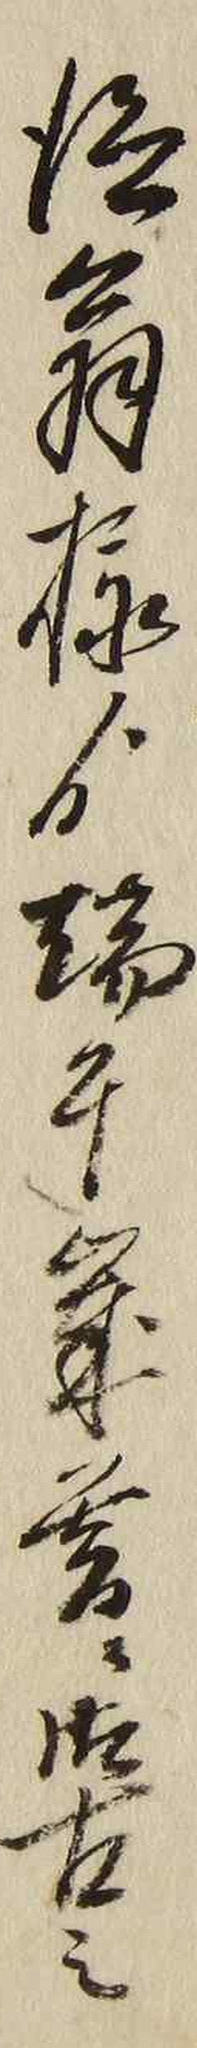徳翁様ゟ端午歳暮ニ御古之
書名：諸士系譜　巻之351　す之部1
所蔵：会津若松市立会津図書館
